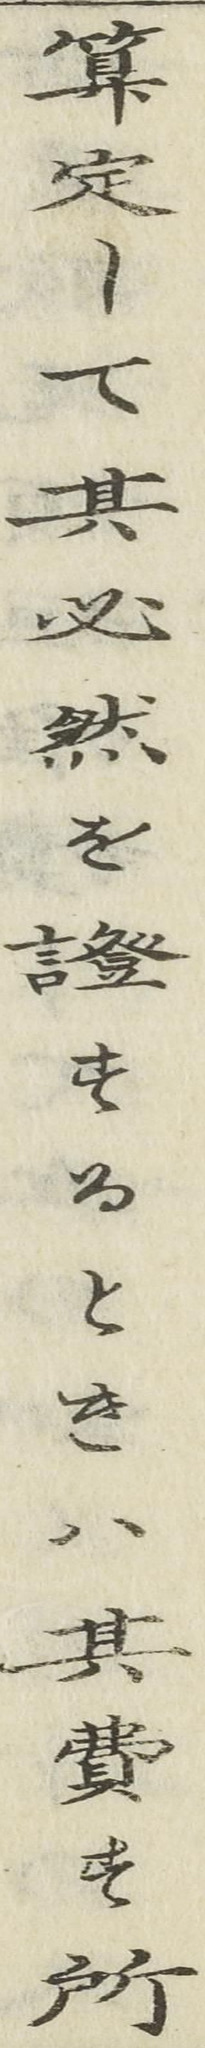算定して其必然を証するときは其費す所
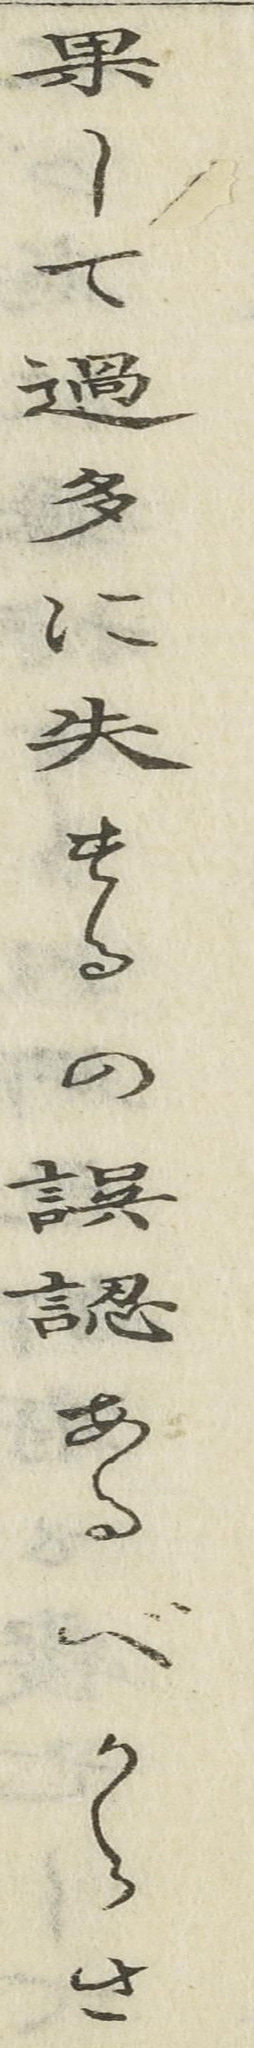果たして過多に失するの誤認あるべからさ
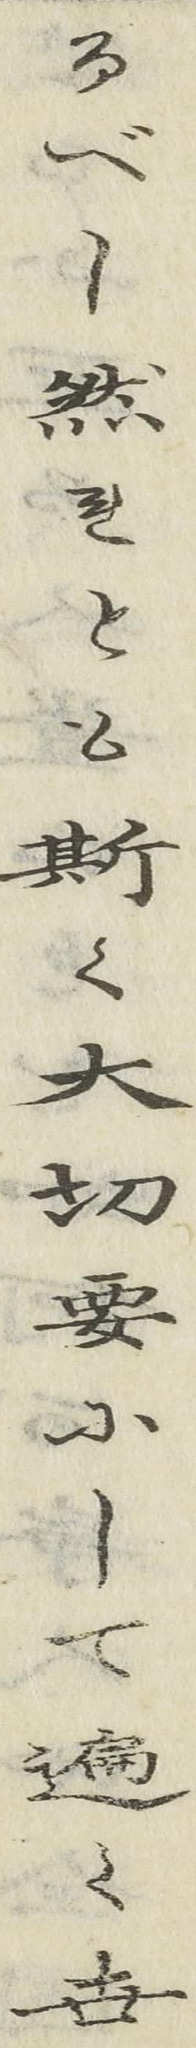るべし然れども斯く大切要にして適々世
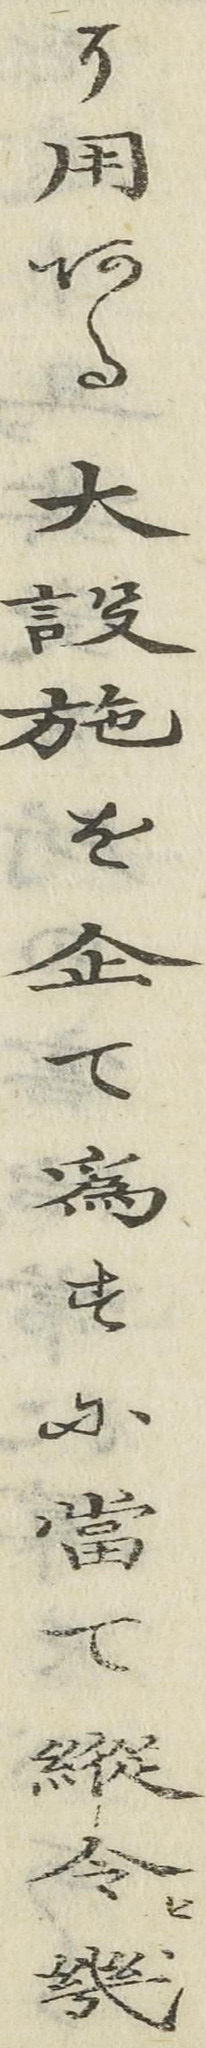に用ある大設施を企て為すに当て縦令ひ幾
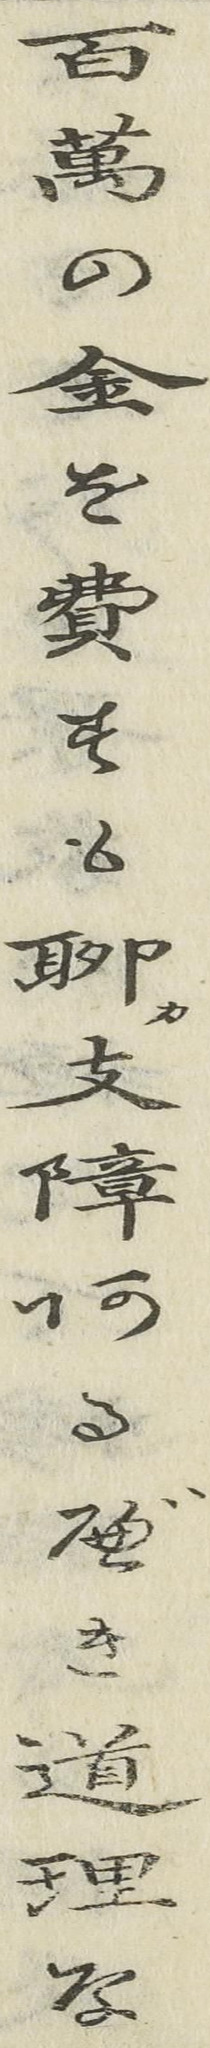百万の金を費すも聊か支障あるべき道理な
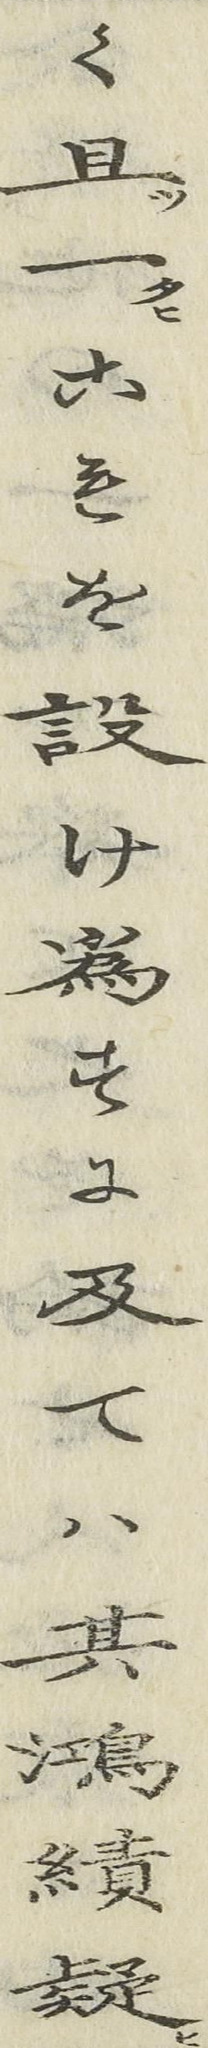く且つ一たびこれを設け為すに及ては其鴻績疑ひ
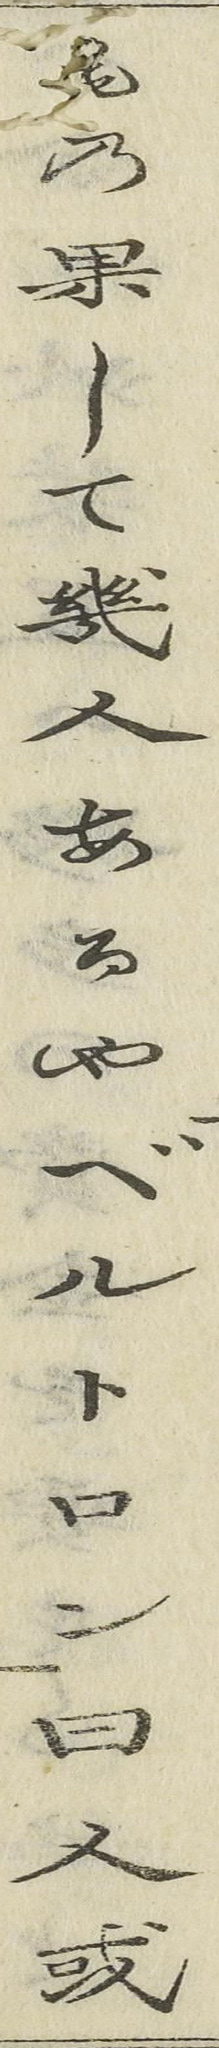もの果して幾人あるや「ベルトロン」曰人或

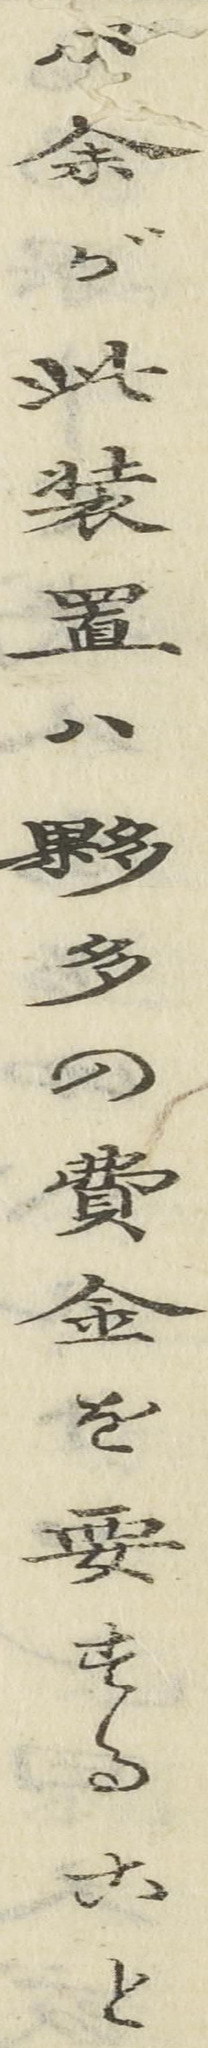は余が此装置は夥多の費金を要すること
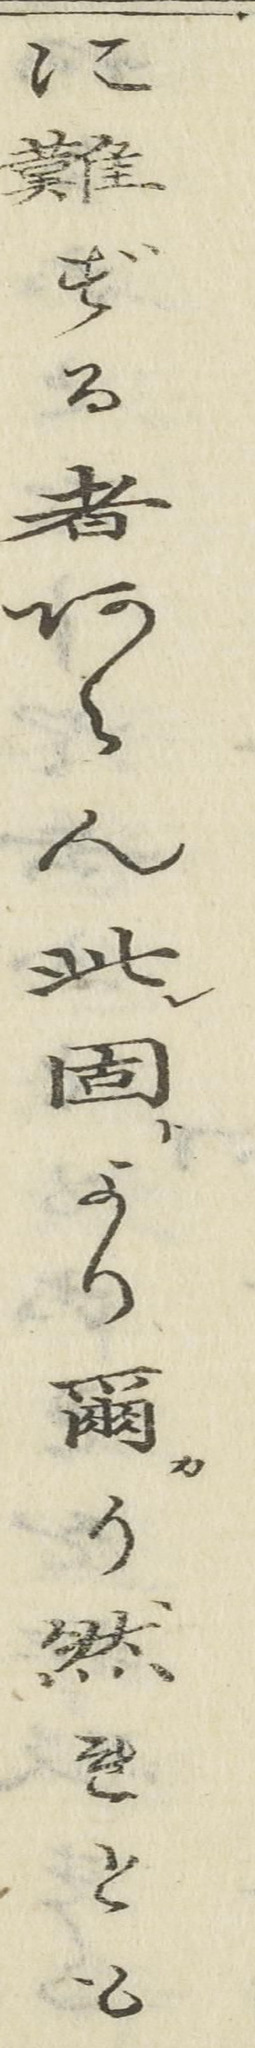に難ずる者あらん此れ固とより爾かり然れども
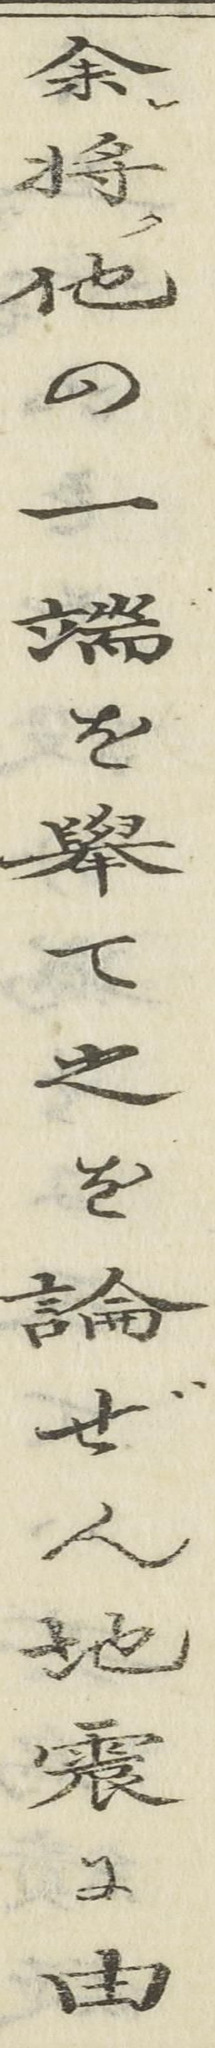余れ将く他の一端を挙て之を論ぜん地震に由
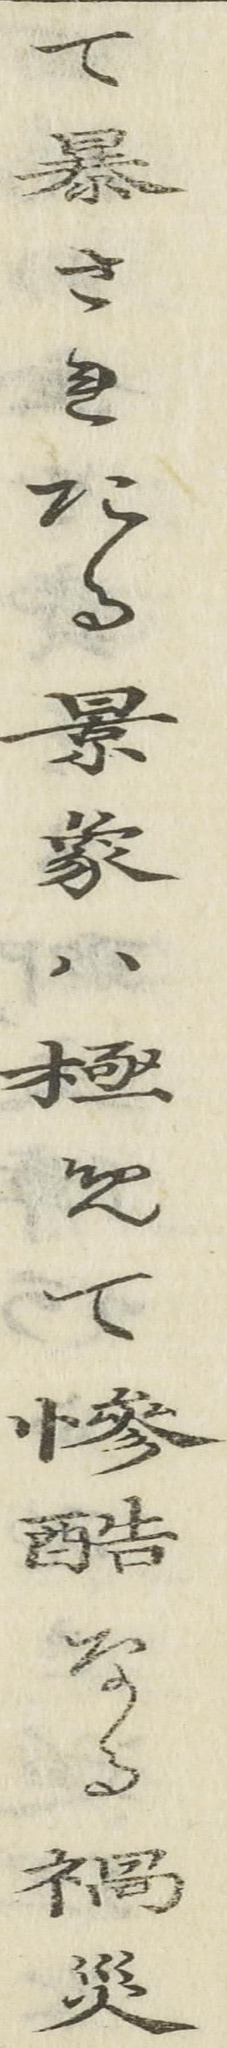て暴されたる景象は極めて惨酷なる禍災
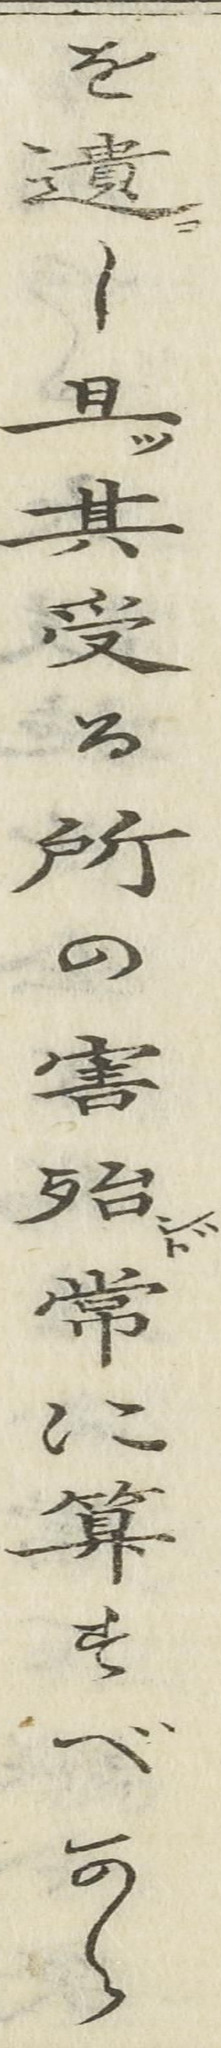を遺し且つ其受る所の害殆ど常に算すべから
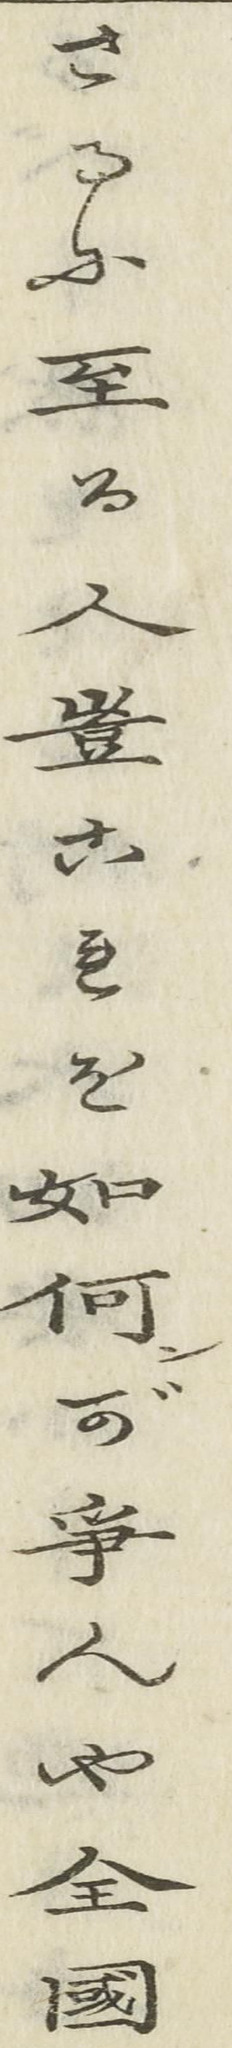さるに至る人豈これを如何争んや全国
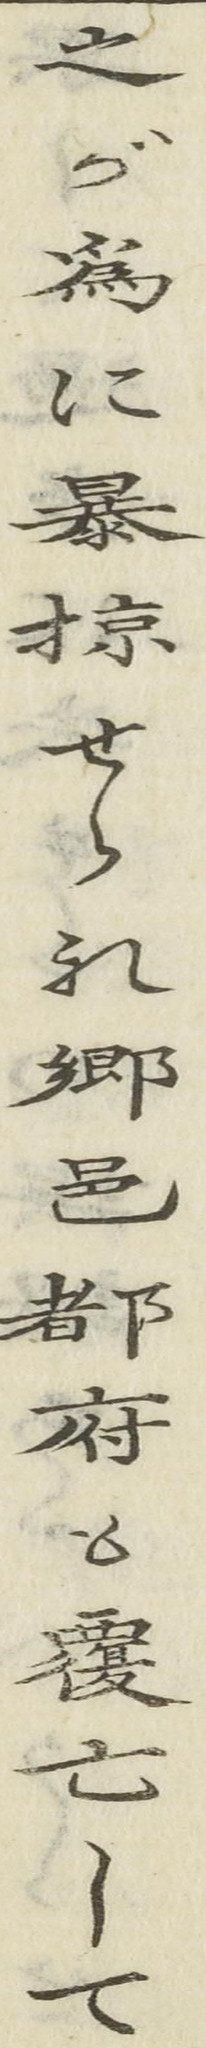之が為に暴掠せられ郷邑都府も覆亡して
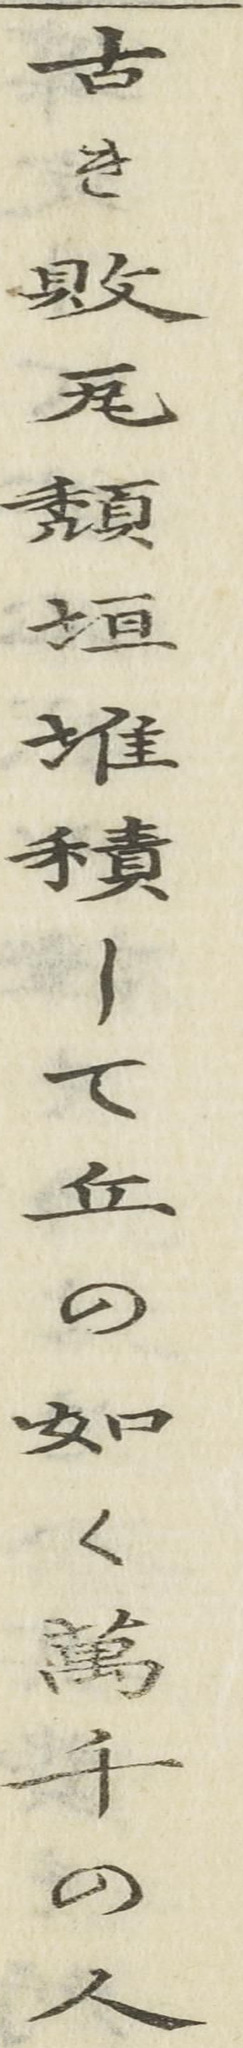古き敗瓦頽垣堆積して丘の如く萬千の人
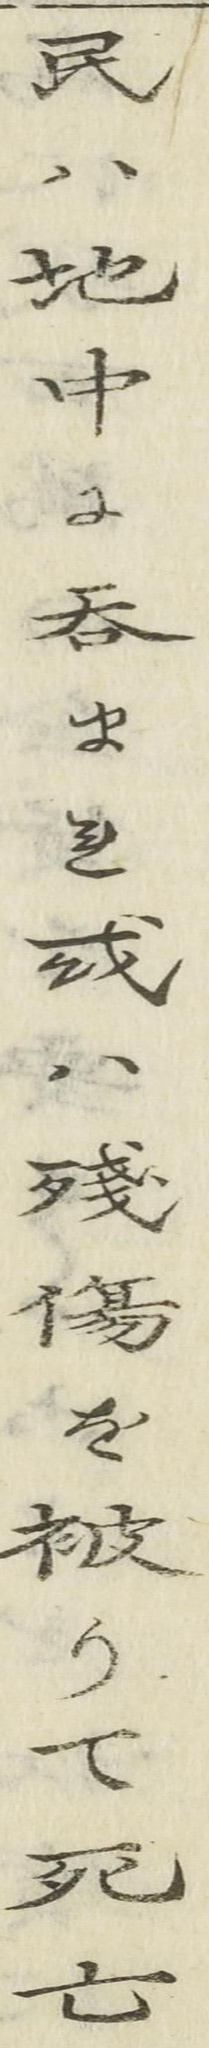民は地中に呑まれ或は残傷を被りて死亡
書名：地震預防説
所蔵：東京大学地震研究所図書室 Earthquake Research Institute Library, The University of Tokyo, JAPAN
